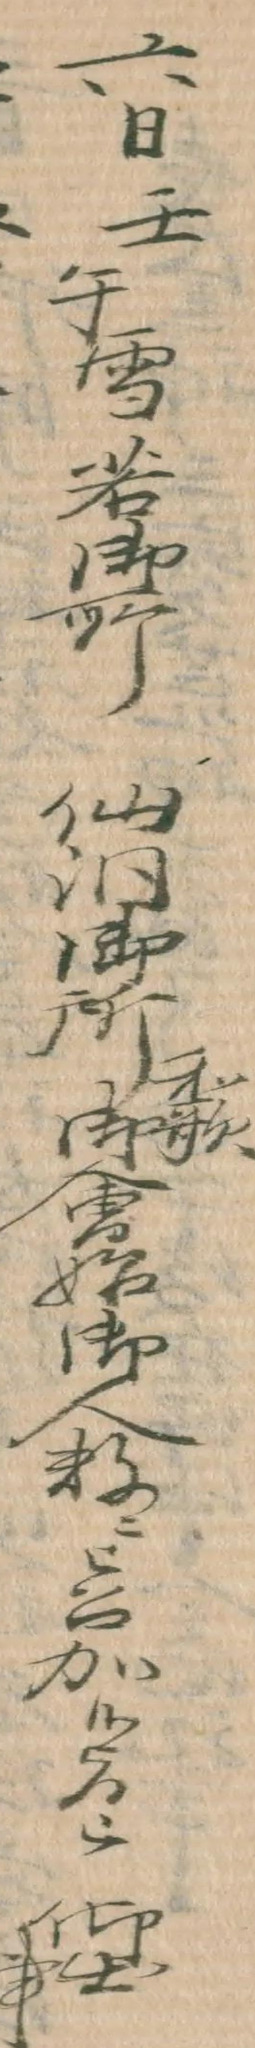六日壬午雪若御所仙洞御所和歌御會始御人数ニ被召加候旨被仰出候事
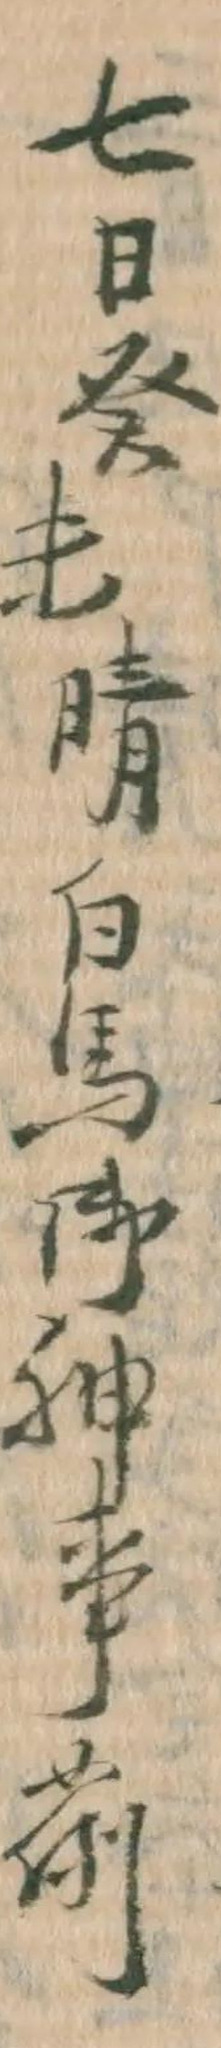七日癸未晴白馬御神事如例
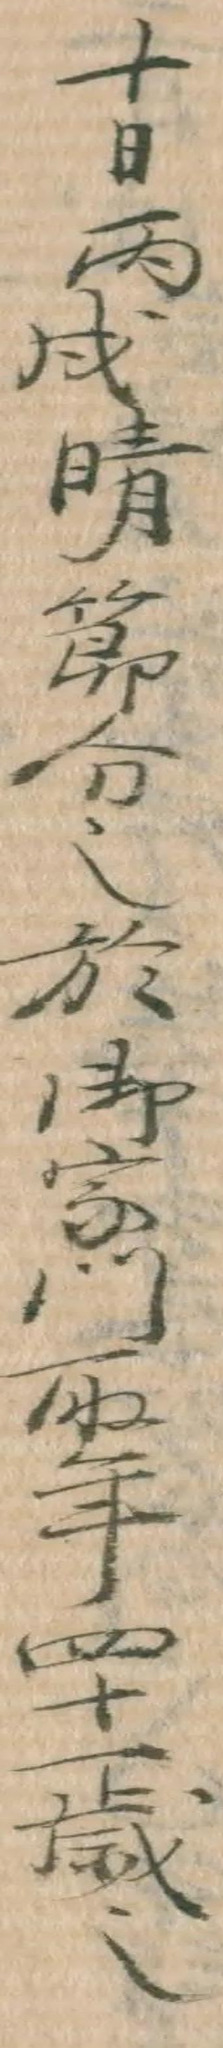十日丙戌晴節分也於御家門取年四十一歳也
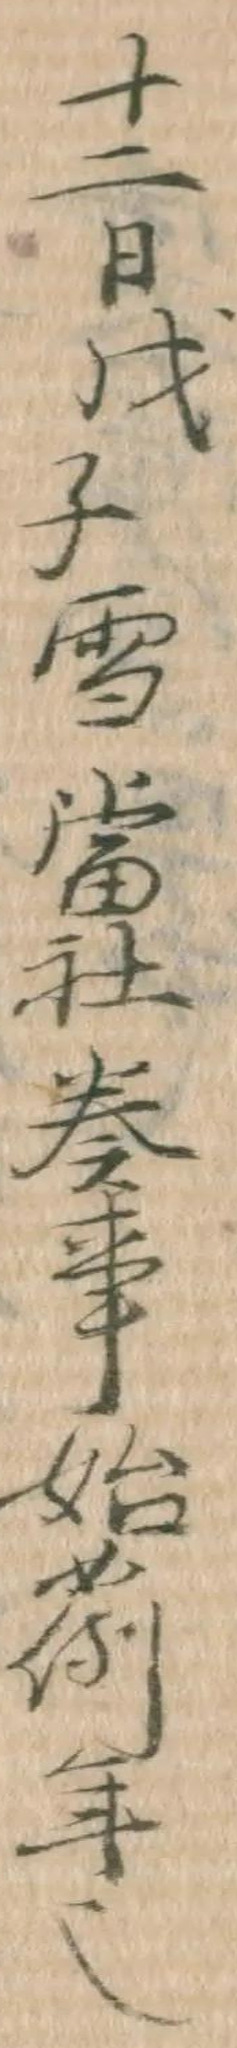十二日戊子雪當社奏事始如例年也
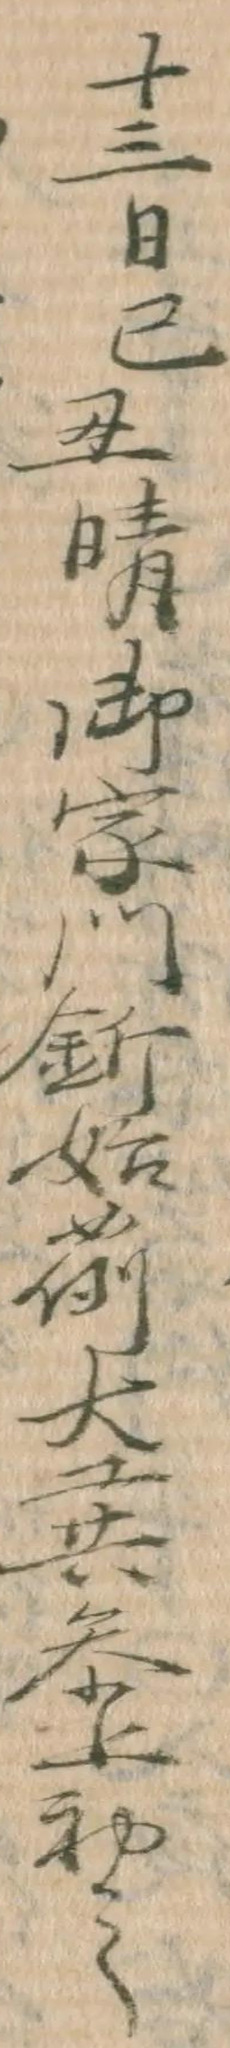十三日己丑晴御家門釿始如例大工共参上勤之
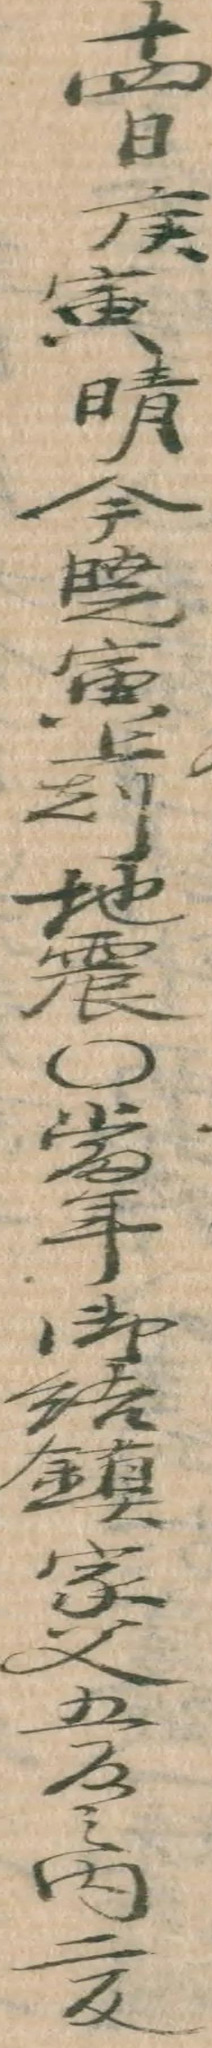十四日庚寅晴今晩寅上刻地震○當年御結鎮家父五反之内二反
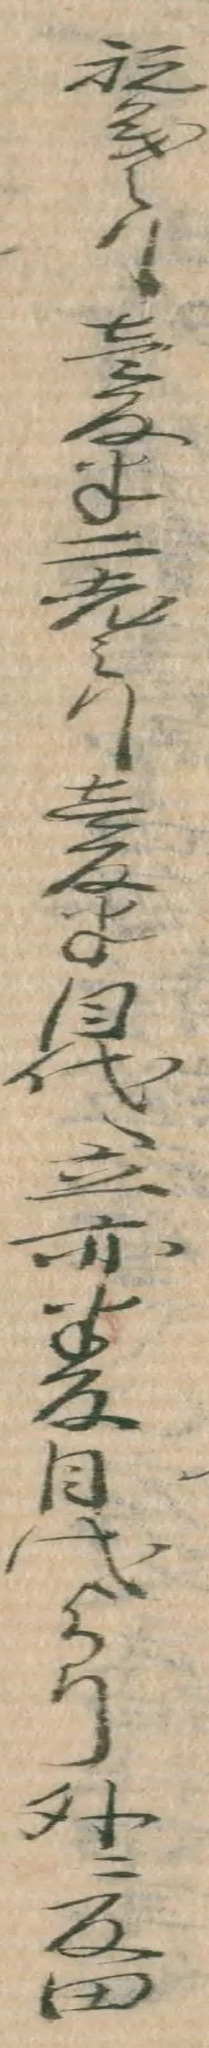祝義之外壱反半二老之引壱石半目代へ立亦半反目代より外ニ反田
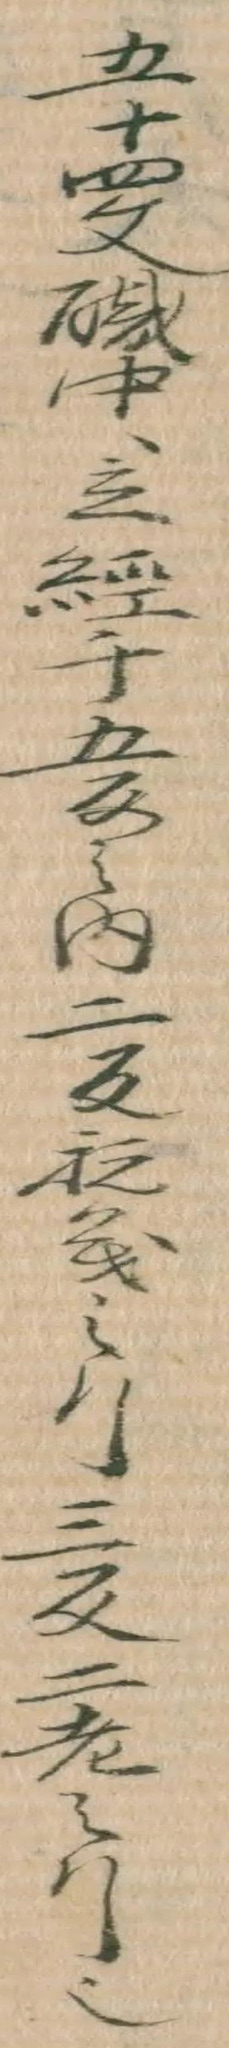五十四文職中へ立経千五反之内二反祝義之引三反二老之引也
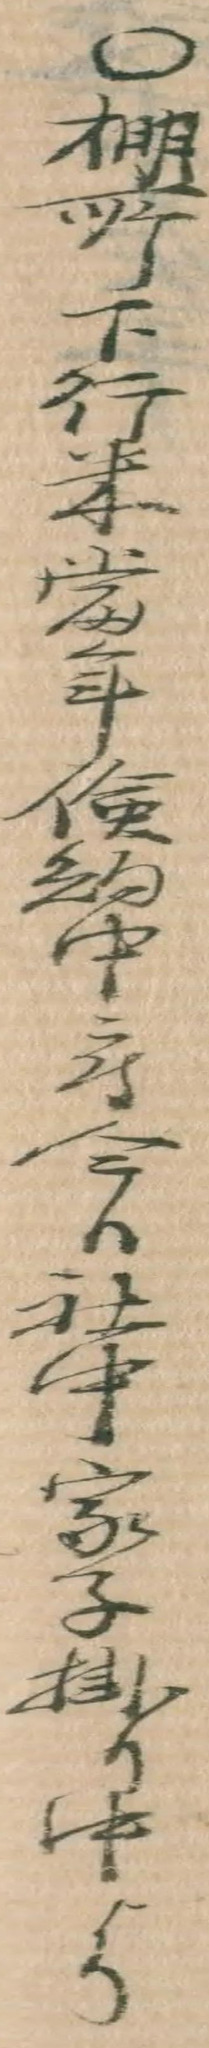○棚所下行米當年倹約中ニ付今日社中家子掛り中より
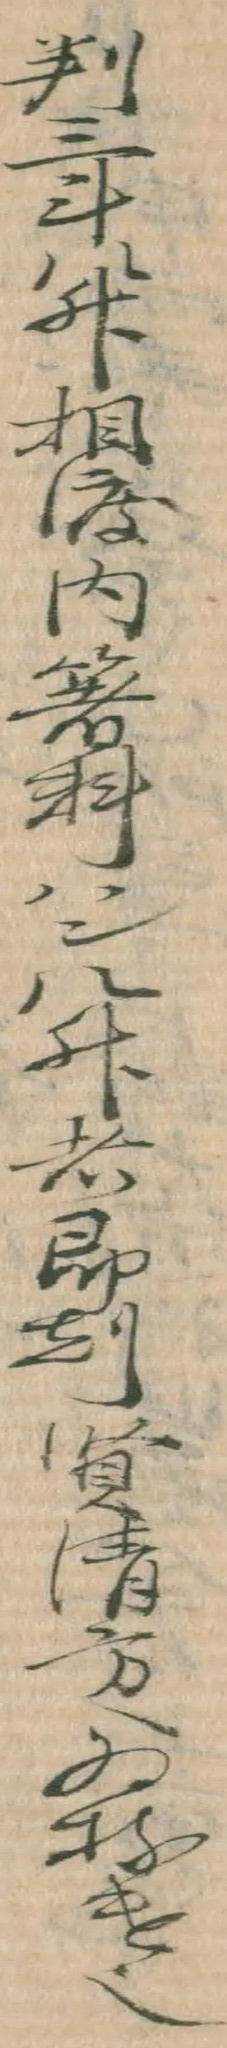判三斗八升相渡内箸料ハン八升者即刻賢清方へ為持遣也
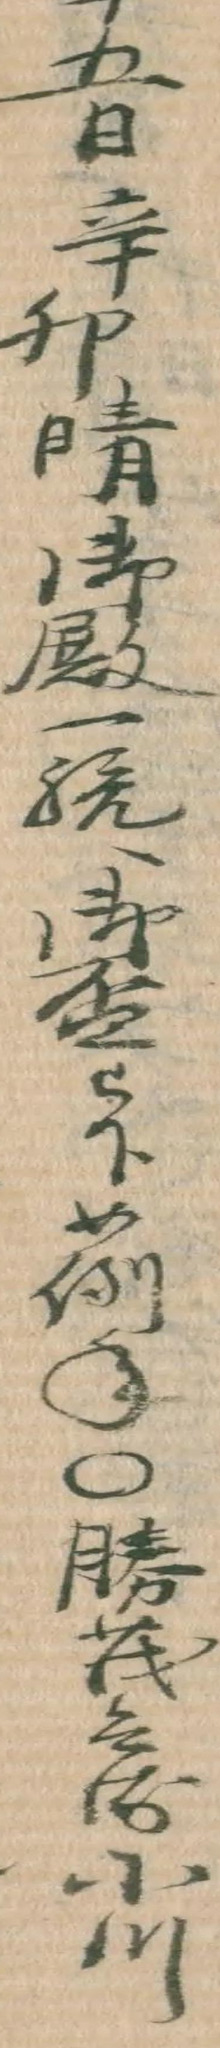十五日辛卯晴御殿一統へ御盃被下如例年○勝茂兵衛小川
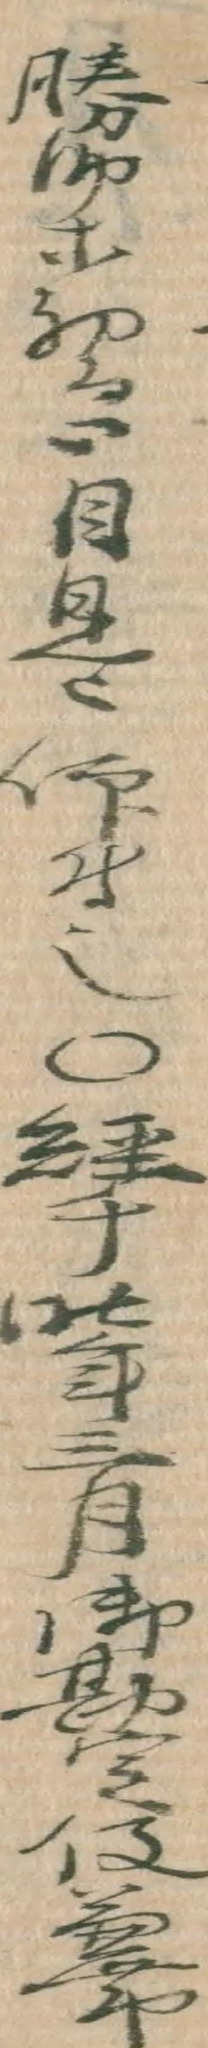勝助等初而御目見被仰付也○経千昨年三月御勘定役兼帯
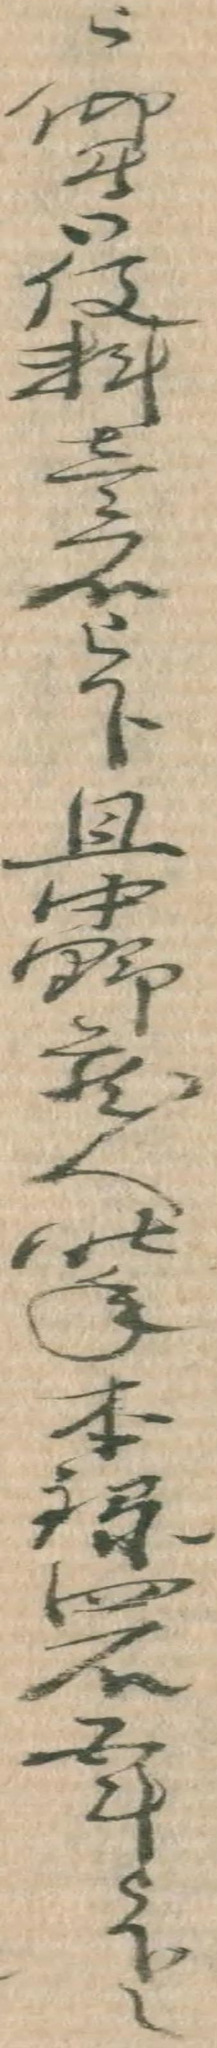被仰付御役料壱石被下且中野蔵人昨年本禄四石五斗被下之
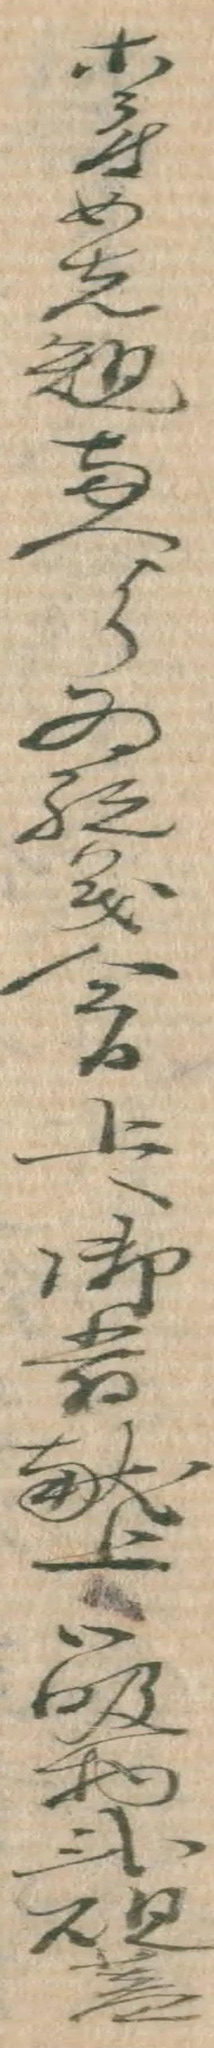等ニ付如先規両人より為祝義今日上へ御肴献上候御吸物弐硯蓋
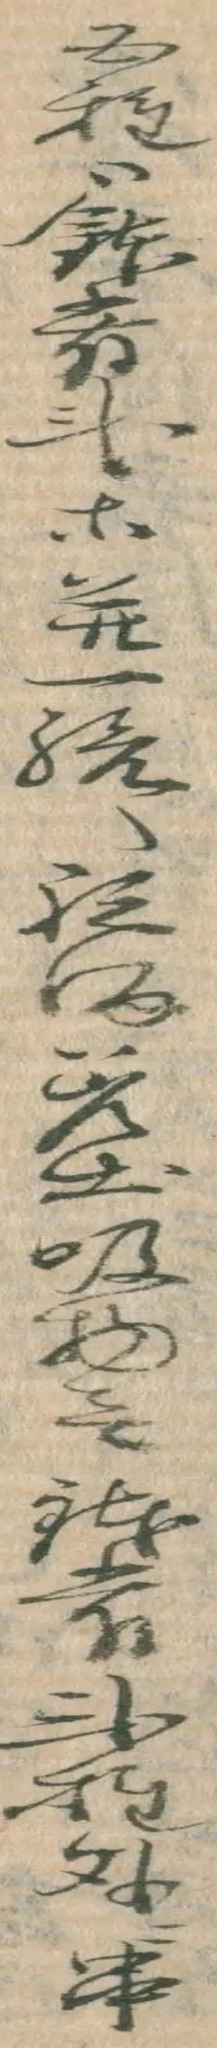五種御鉢肴斗等幷一統へ祝酒差出吸物壱鉢肴弐種外ニ串
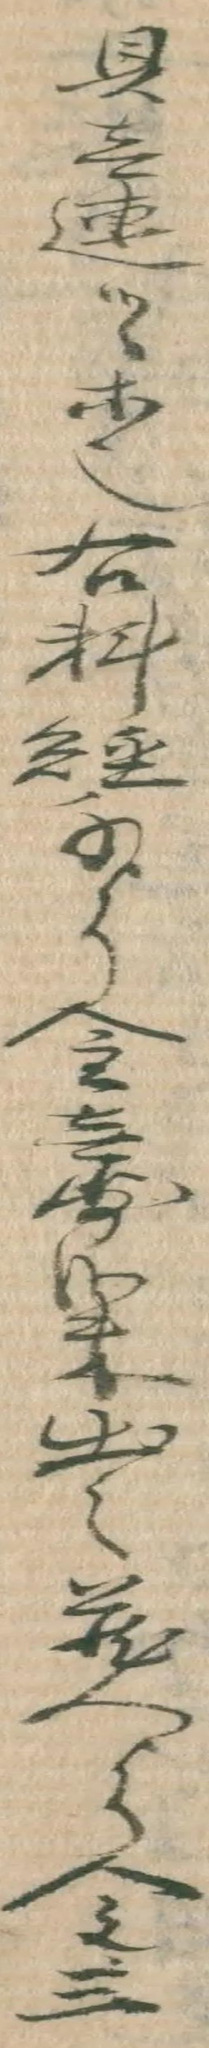貝壱連ツヽ等也右料経千より金壱升弐朱出之蔵人より人金三
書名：賀茂社記録. 第65冊
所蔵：国立国会図書館 National Diet Library, JAPAN
